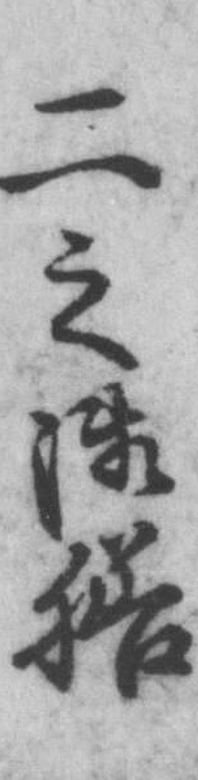二之御膳
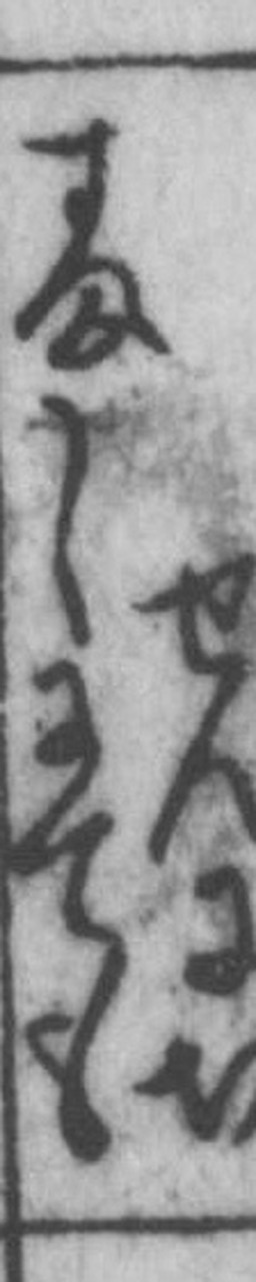すましにても
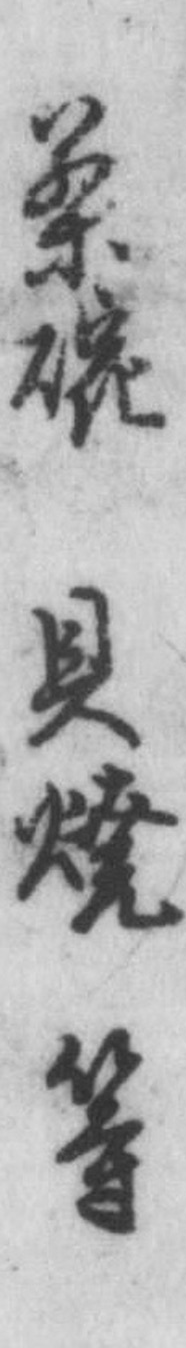茶碗貝焼箸
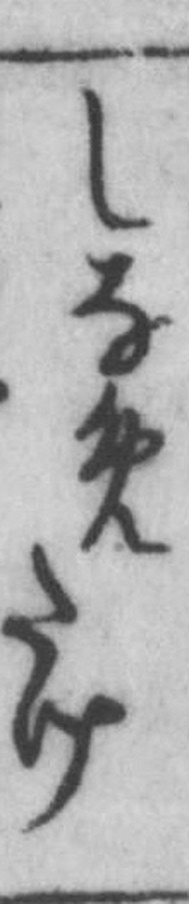しなめたげ
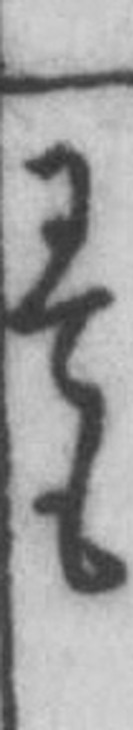にても
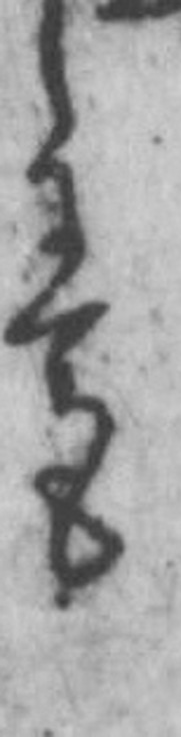にても
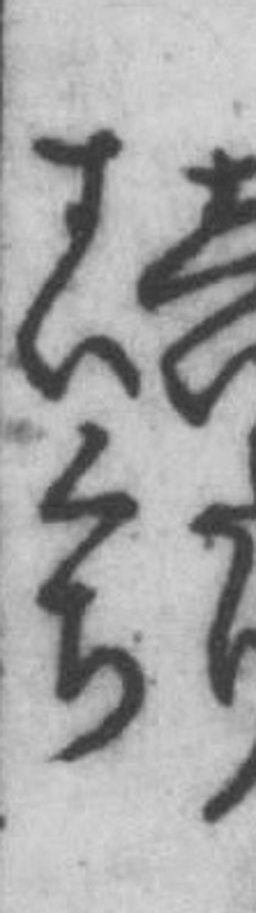すいくち
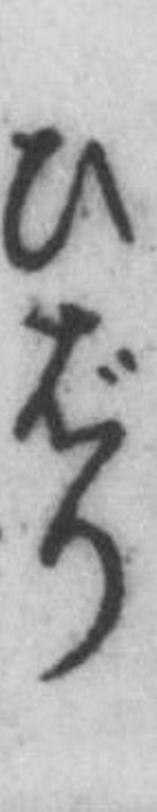ひばり
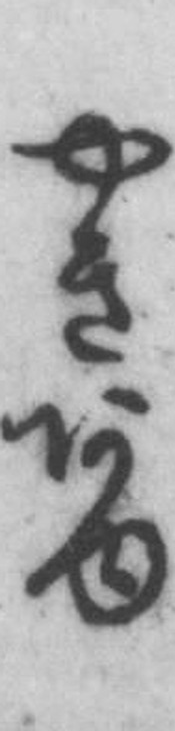やきあゆ
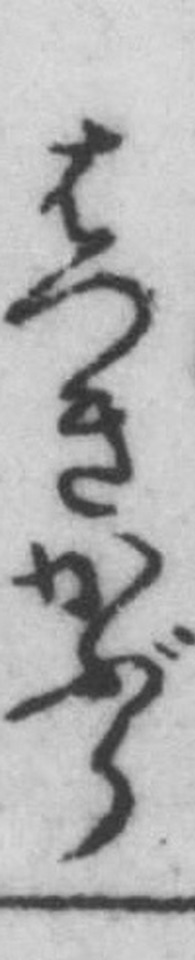はつきかぶら
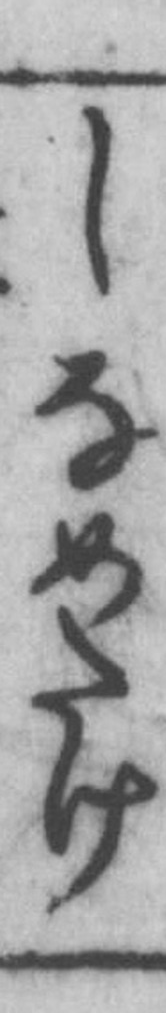しなめたげ
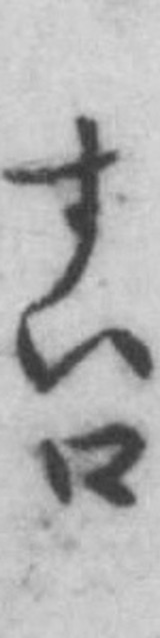すい口
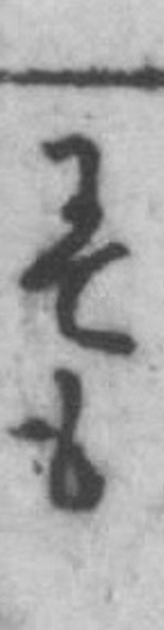にても
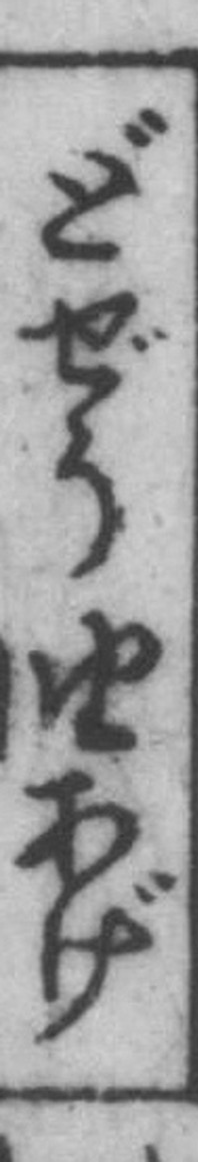どぜう油あげ
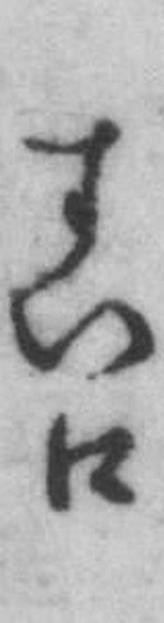すい口
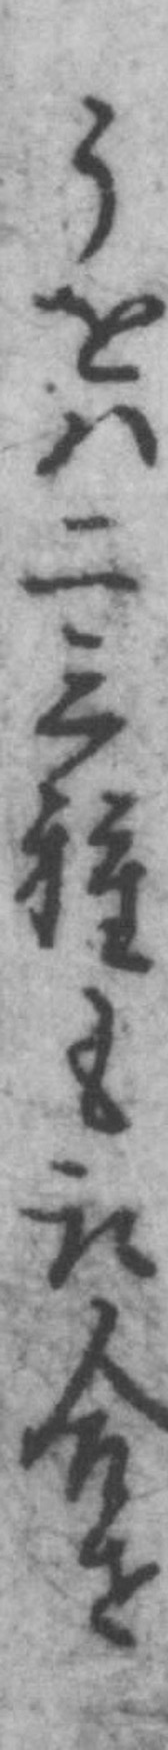うをハ二三程も取合を
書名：料理献立抄
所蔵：大阪府立大学学術情報センター 国文学研究資料館
